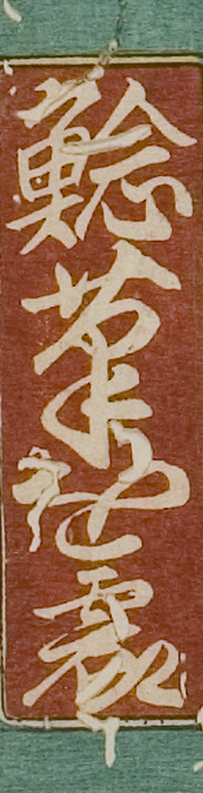鯰筆を震
